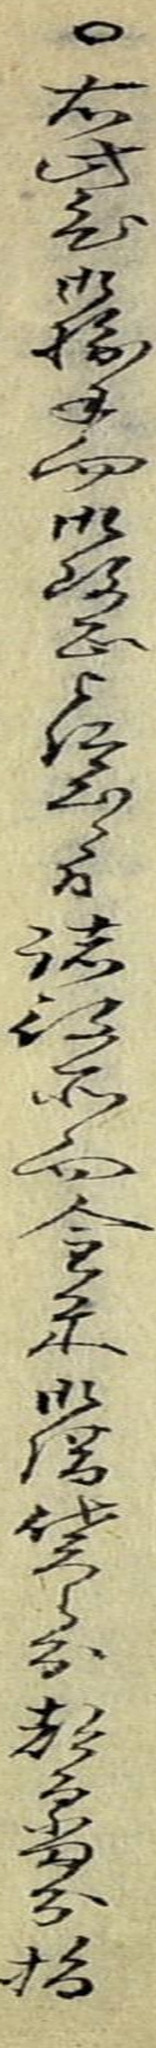○右此度御勝手向御改正被仰出候に付諸役所向金米御借貸之分都而当分指
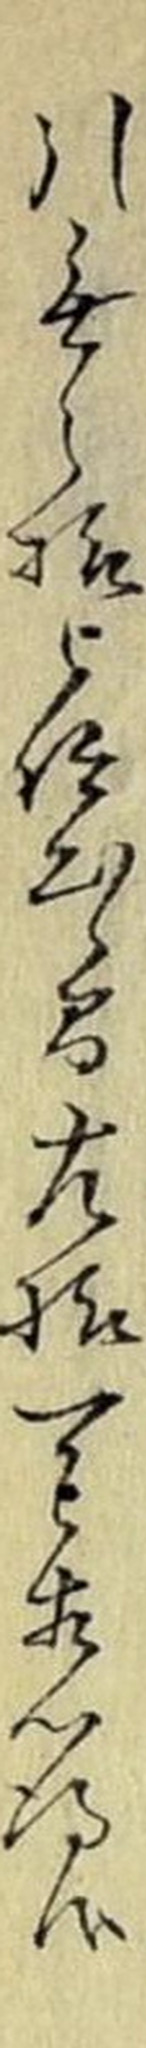引無之趣被仰出候間左様可被相心得候
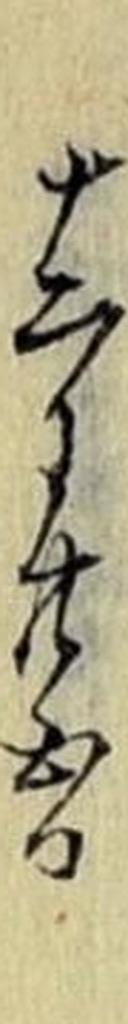十二月廿五日
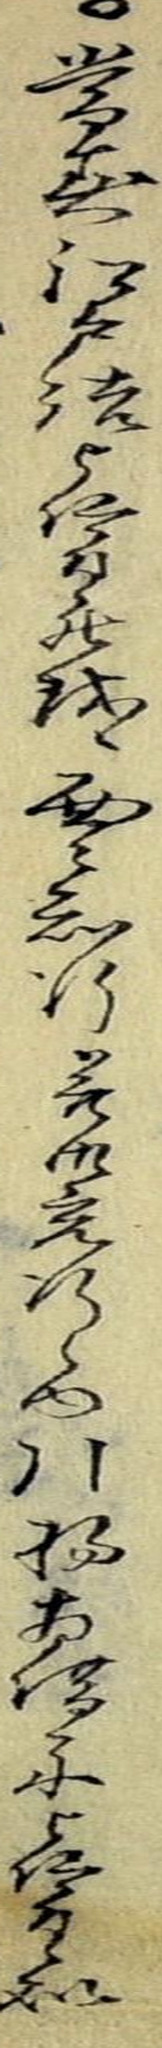○当春江戸詰被仰付罷越候面々知行并御充行之内引揚拝借米被仰付候処
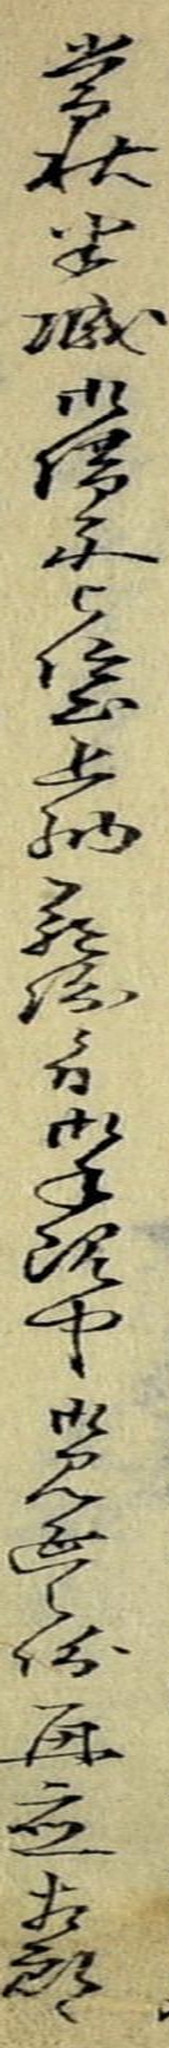当秋半減御借米被仰出上納難儀に付御年限中御見延之儀再応相願候
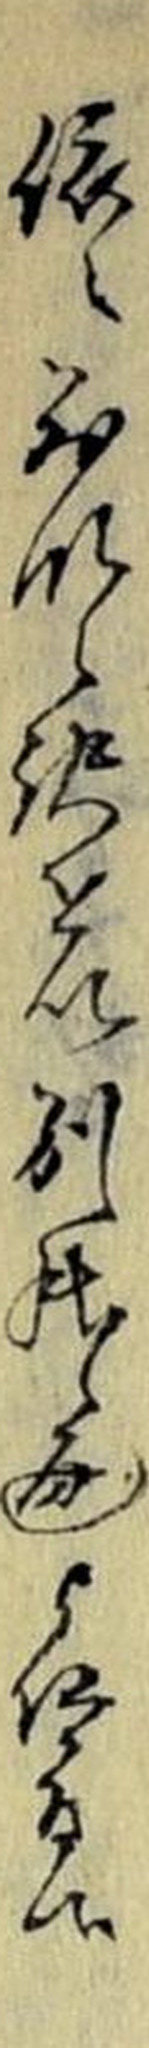依之別段之訳を以別紙之通被仰付候
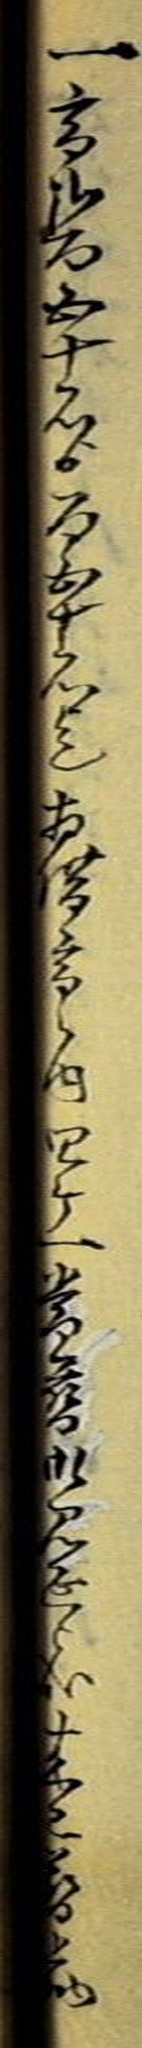一高弐百五十石ゟ百五十石迄拝借高之内四ヶ一当暮御見延被成来巳暮上納
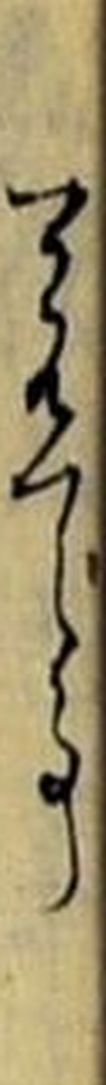可有之事
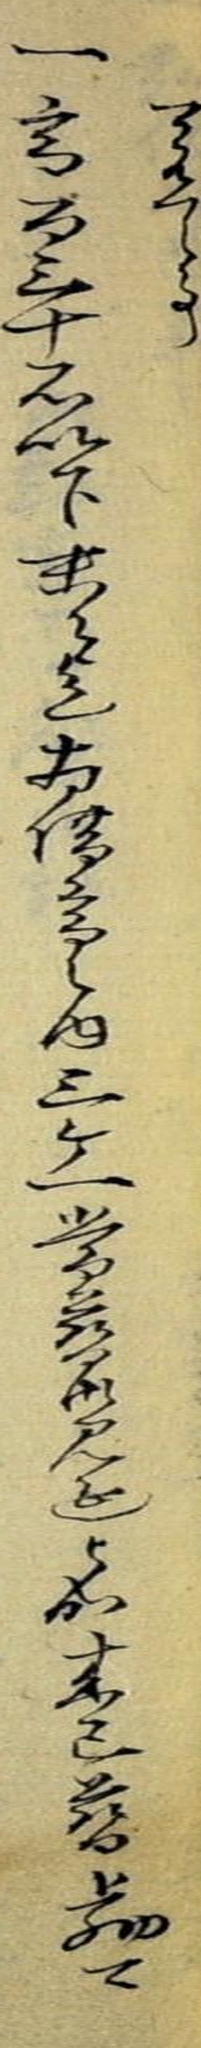一高百三十石以下末々迄拝借高之内三ヶ一当暮御見延被成来巳暮上納可
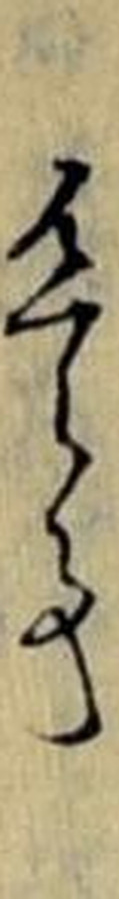有之事
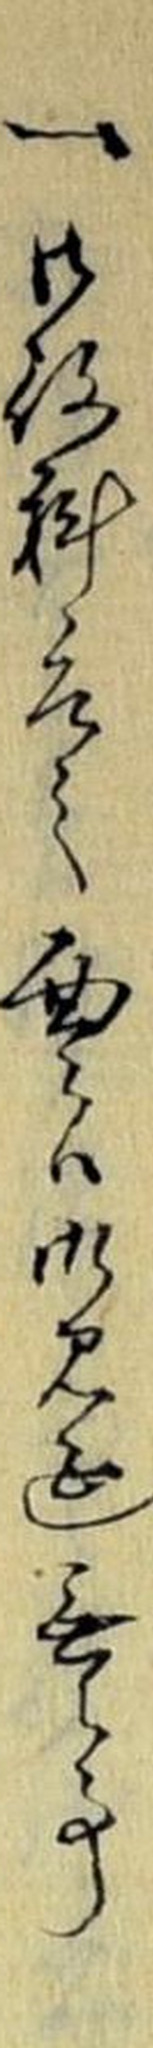一御役料取之面々は御見延無之事
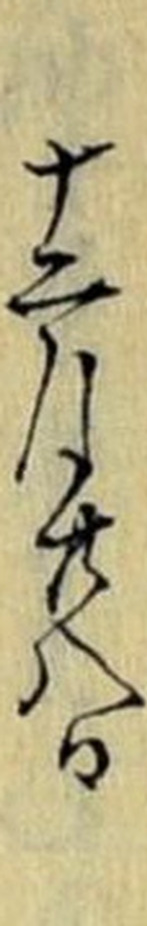十二月廿八日

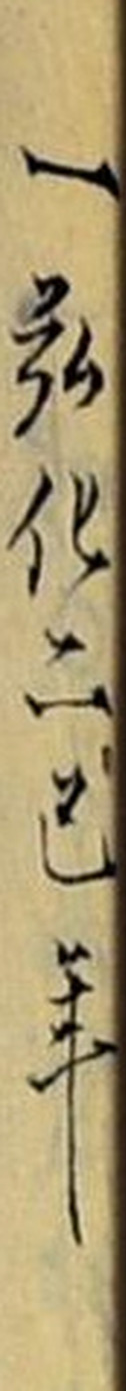一弘化二巳年
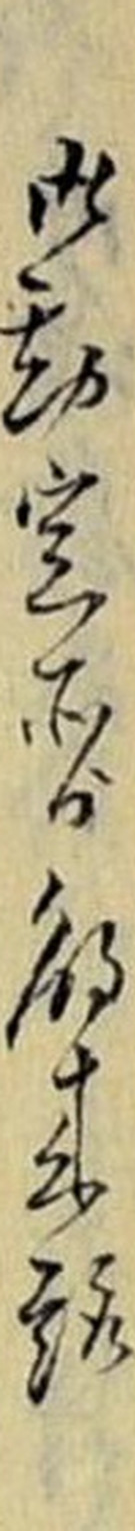御勘定所ゟ触来趣
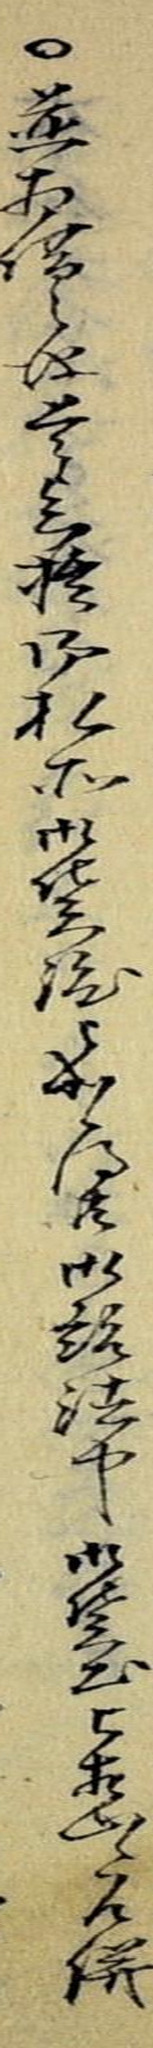○並拝借之儀是迄於御札所御貸渡被成候得共御趣法中御貸出被相止乍併
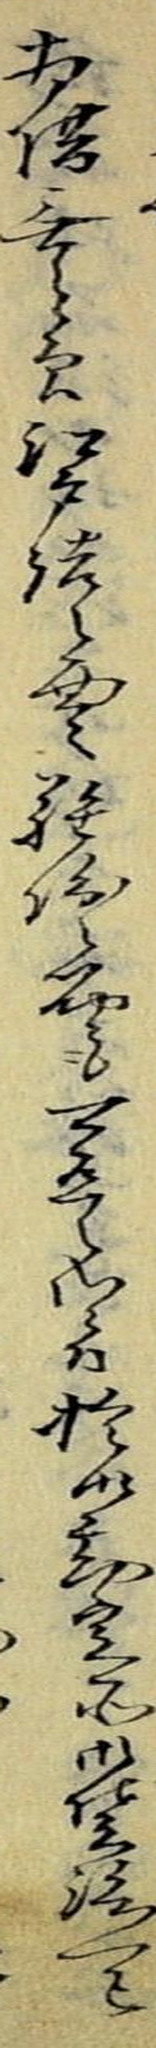拝借無之候而は江戸詰之面々難儀之筋も可有之哉に付於御勘定所御貸渡可被
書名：命令之部 六
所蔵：福井県文書館 Fukui Prefectural Archives
